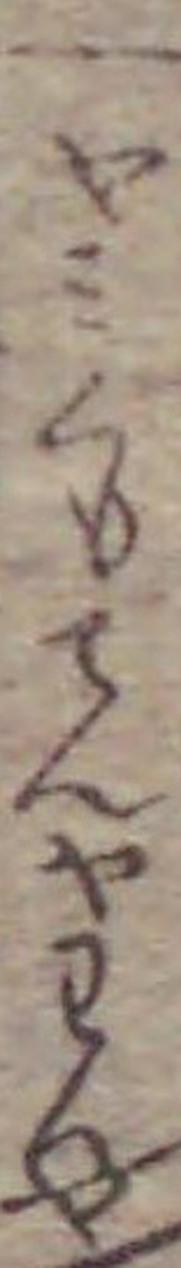やみくもてんやわんや
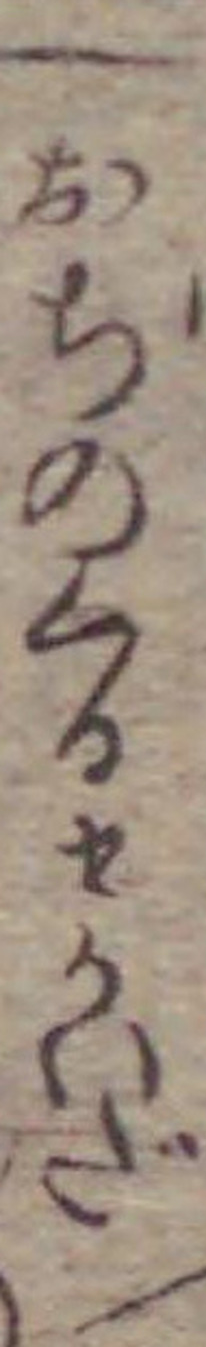おちのくるせかいだ
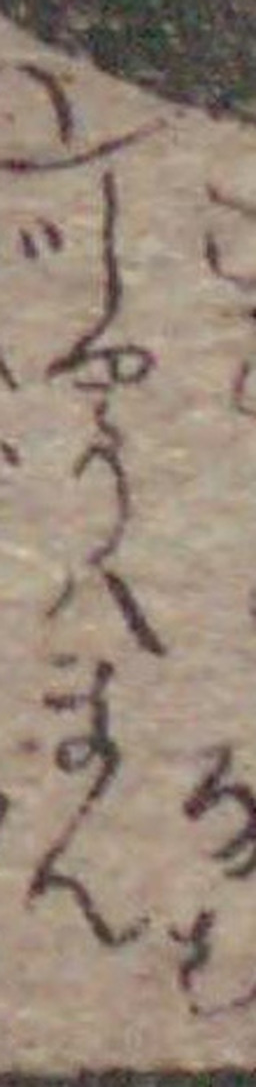しやう八まん
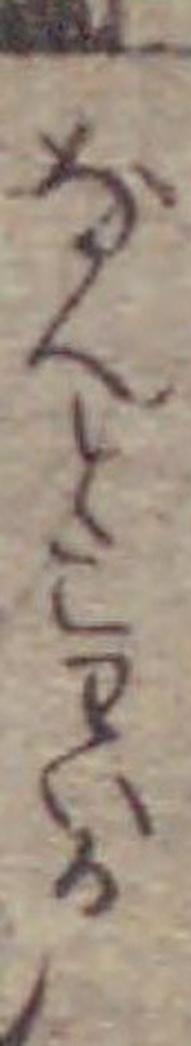なんとこわいか
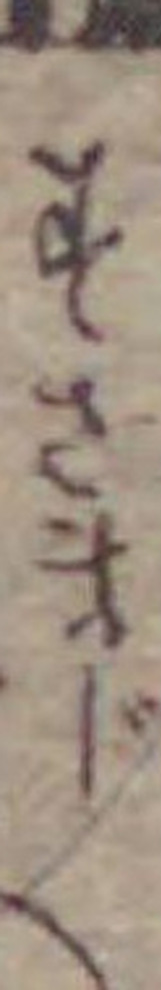すさまじ
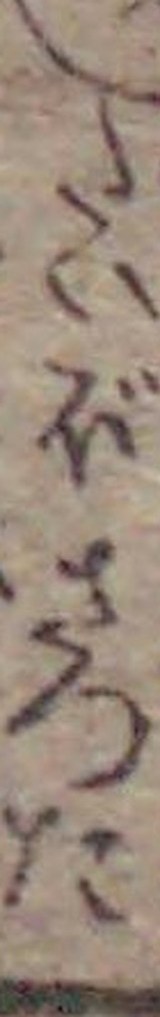だいぼさつた
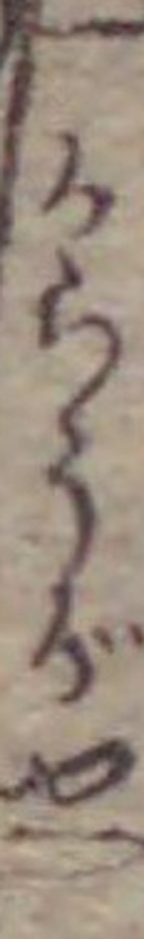からうがや
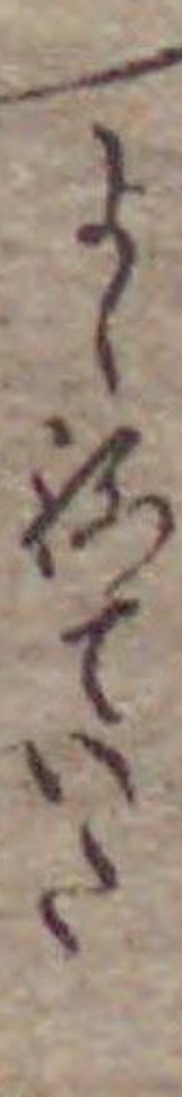よくねていた
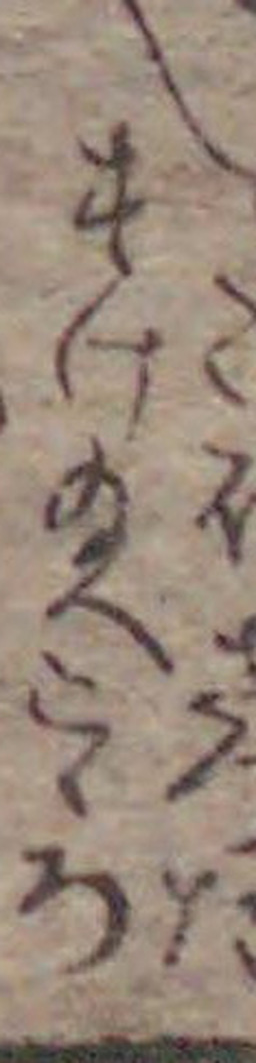すけ給へこゝろ
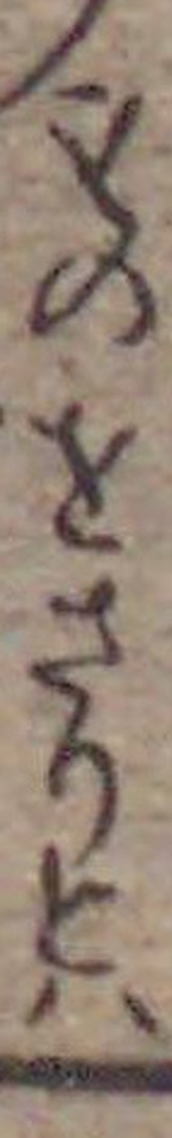ものをさりとは
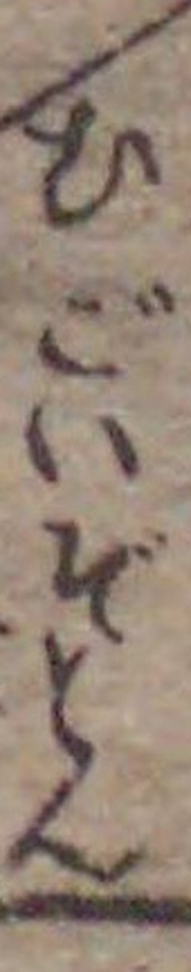むごいぞとん
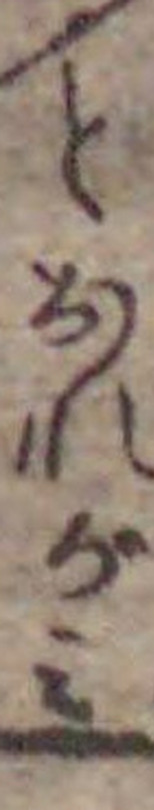とおれがみ
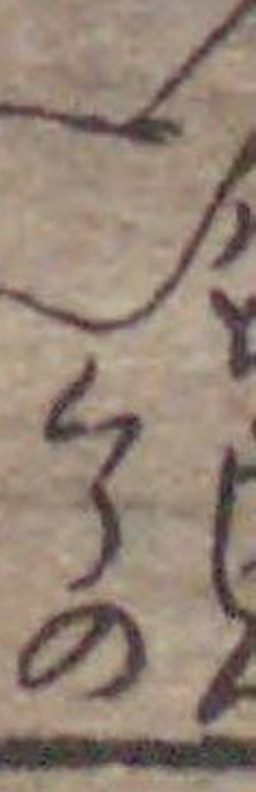くらの
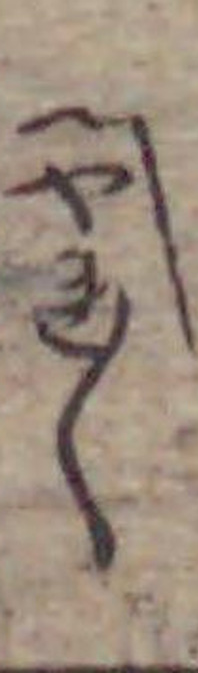〽やれ〳〵
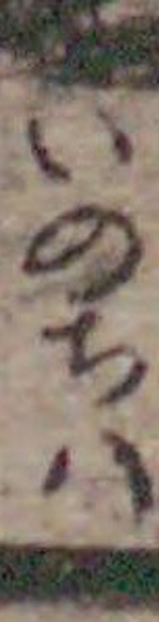いのちは
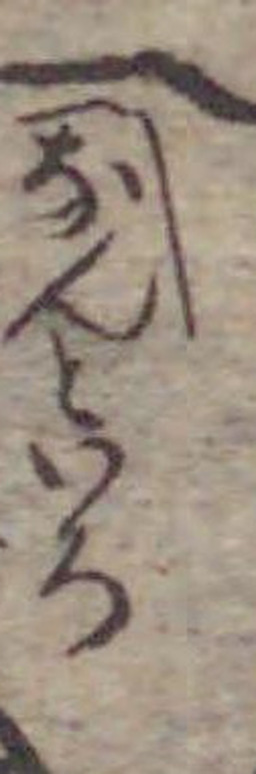〽なんといつ
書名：妖怪仕内評判記 : 2巻
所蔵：国立国会図書館 National Diet Library, JAPAN
